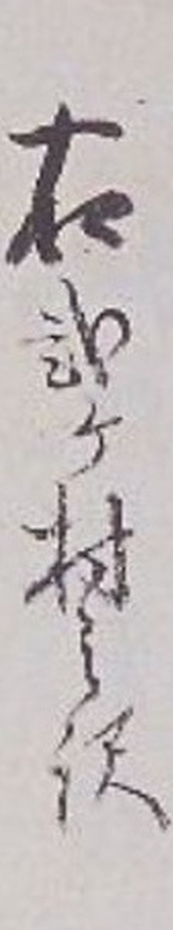右弐ヶ村之訳
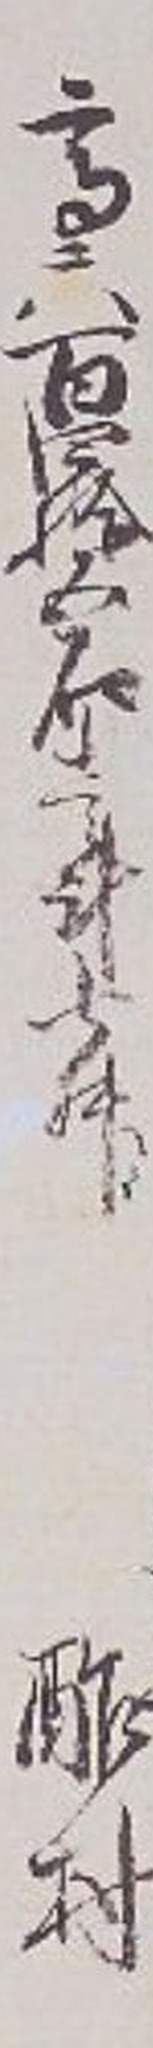高六百四拾五石壱斗七升浅井郡
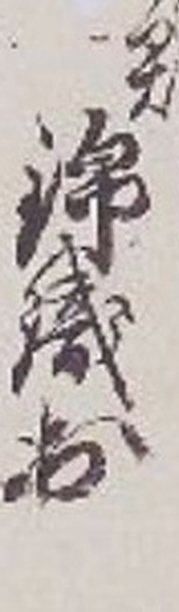錦織村
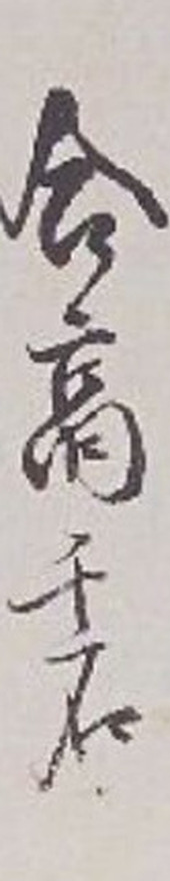合高千石
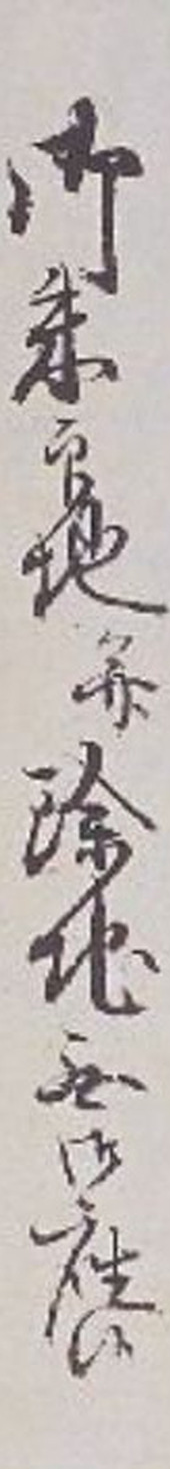御朱印地幷除地無御座候
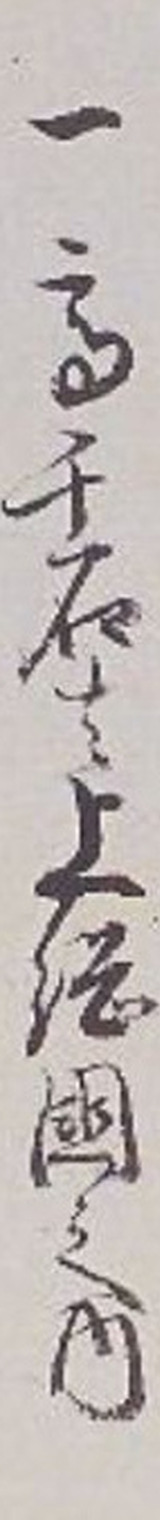一高千石者上総国之内
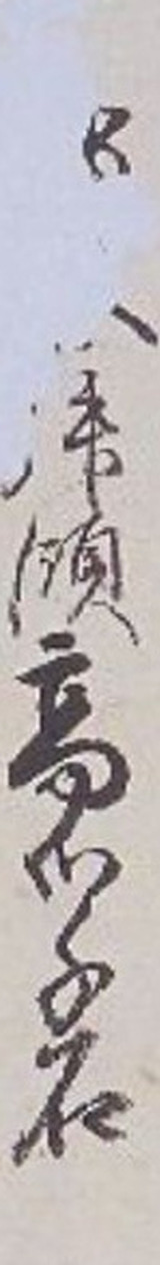拝領高弐千石

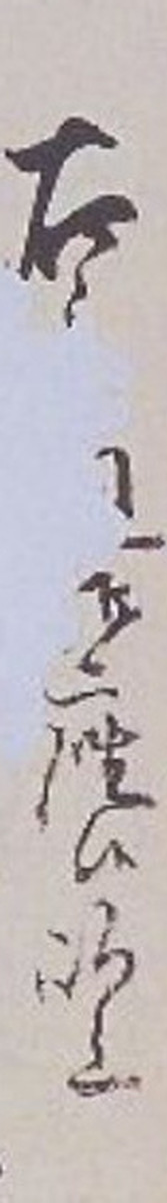右之通御座候以上
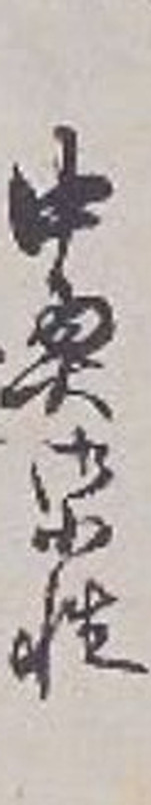中奥御小性
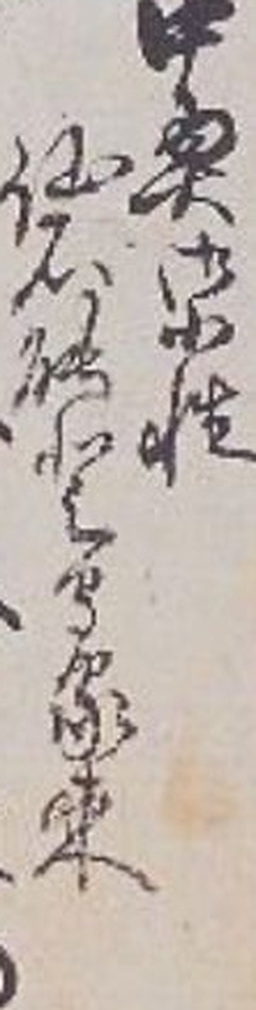仙石能登守家来
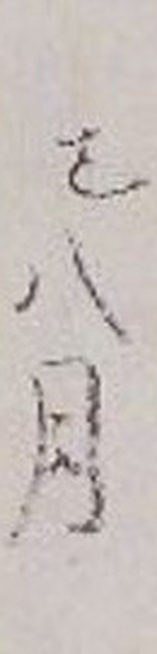巳八月
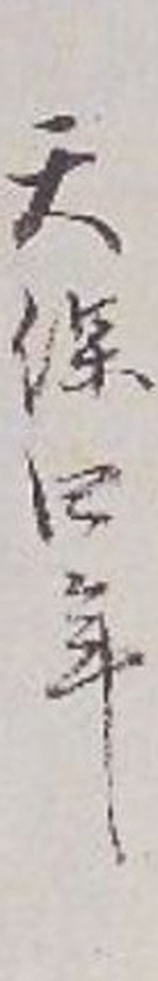天保四年
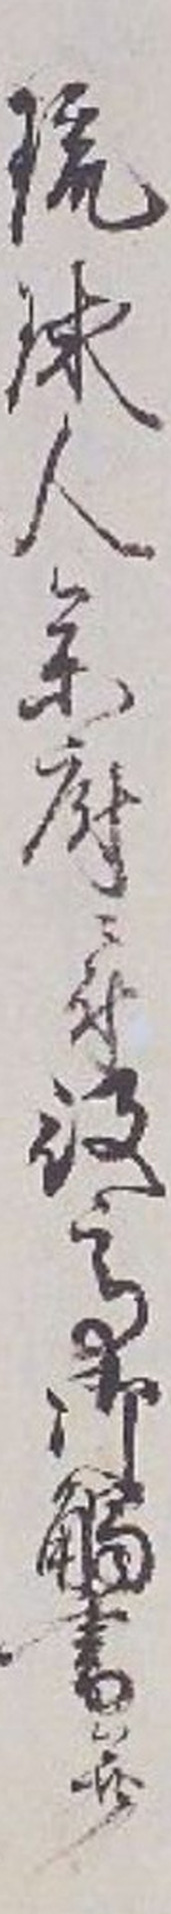琉球人参府に付役高御触書幷
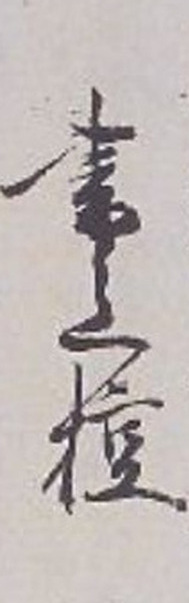書上控
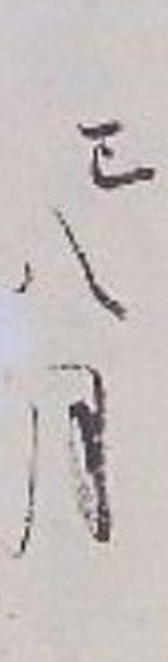巳八月

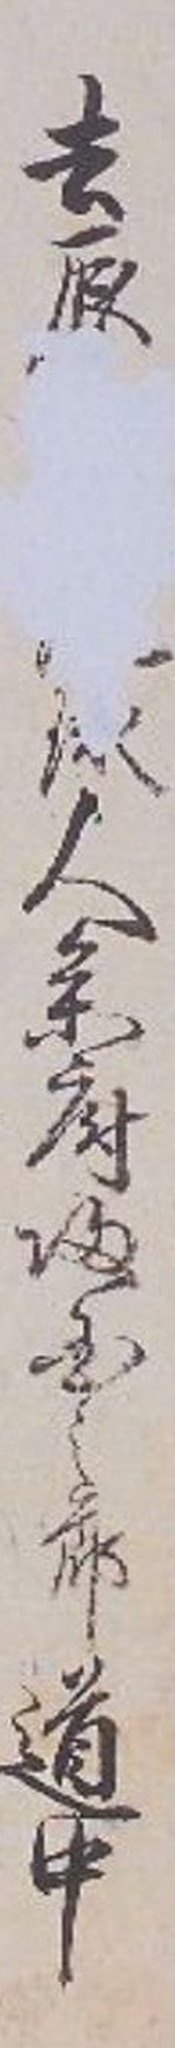去辰人参府帰国之節道中
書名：琉球人帰国に付国役金の記録
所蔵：University of the Ryukyus Library
